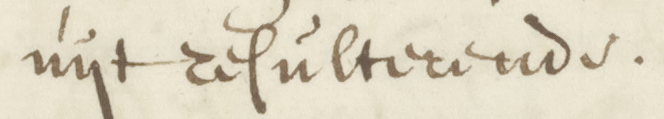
uijt resulterende.
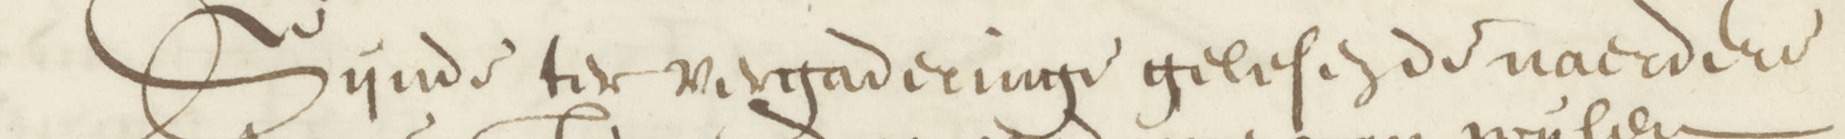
Sijnde ter vergaderinge gelesen de naerdere
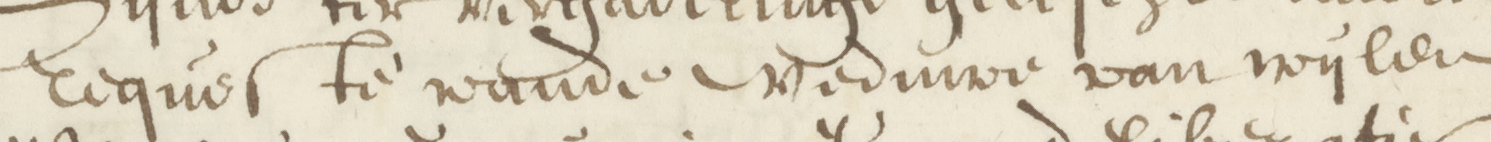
requeste vande weduwe van wijlen
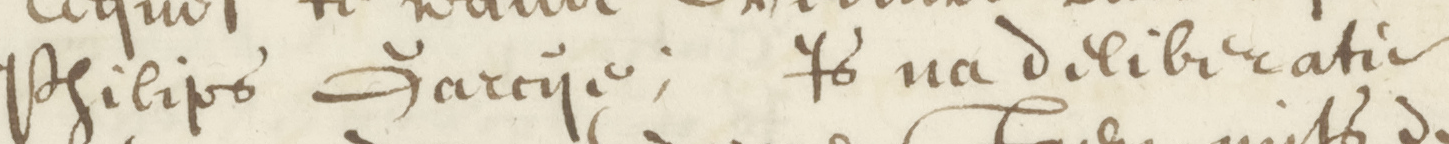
Philips Garcije; Is na deliberatie
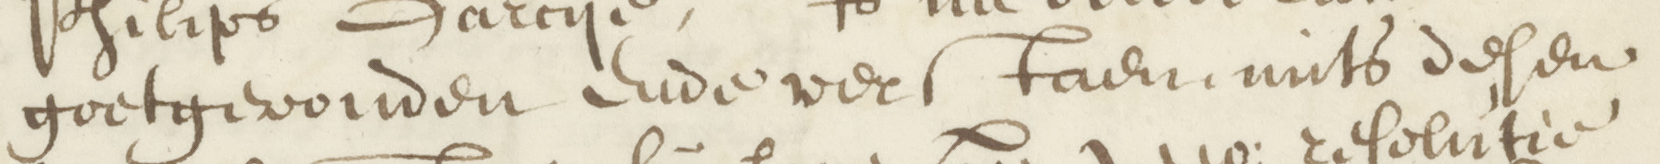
goetgevonden ende verstaen, mits desen
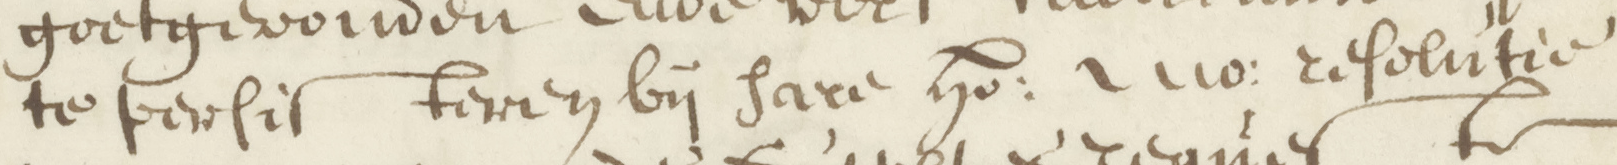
te persisteren bij hare ho:mo: resolutie
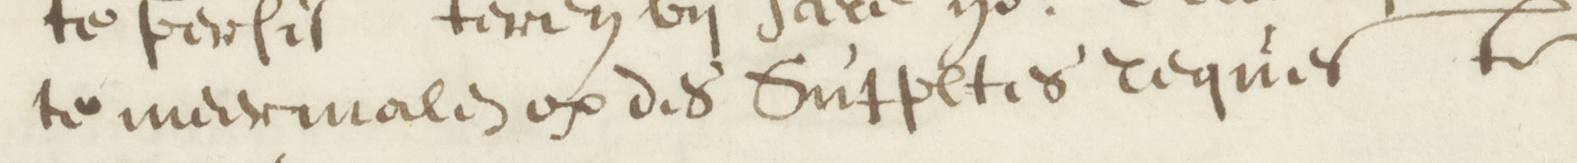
te meermalen op des Suppltes requeste
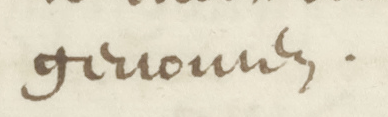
genomen.
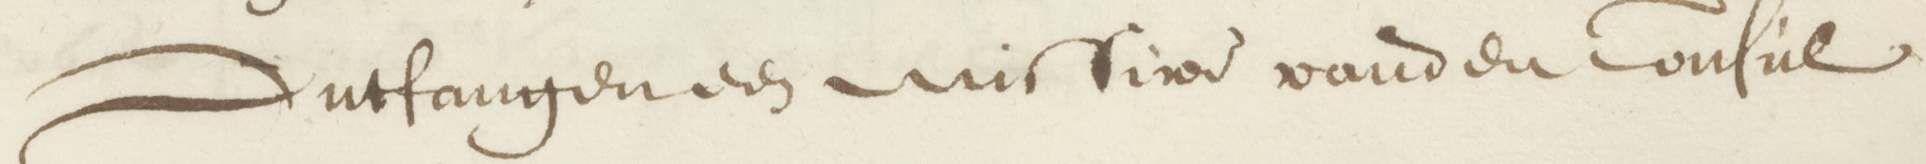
Ontfangen een missive vanden Consul
